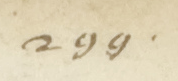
299.
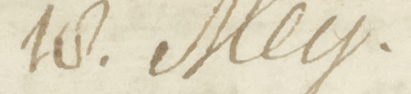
18. Meij.
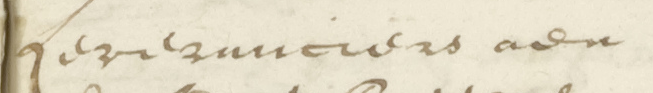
Leveranciers aen
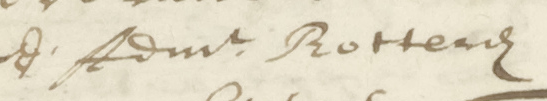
d‛ Admt. Rotterd.
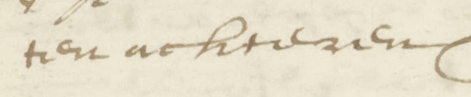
ten achteren„
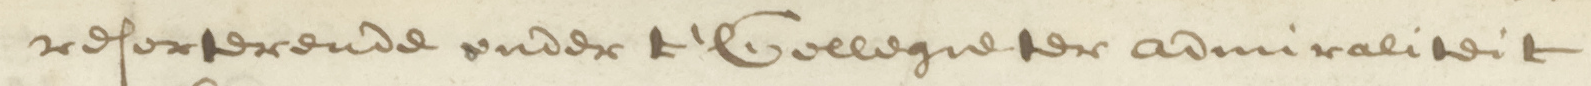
resorterende onder t' Collegie ter Admiraliteit
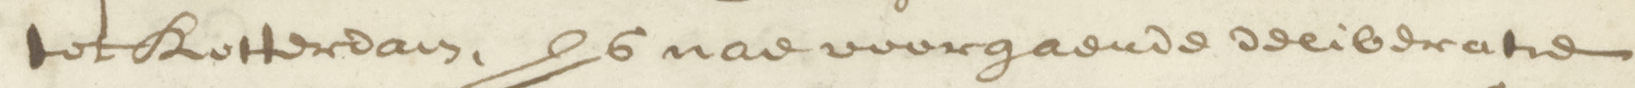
tot Rotterdam, Is nae voorgaende deliberatie
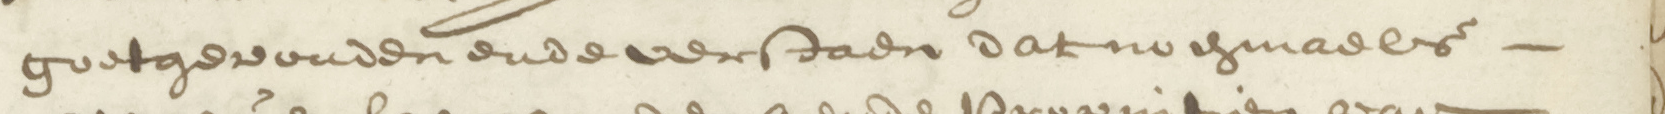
goetgevonden ende verstaen dat nochmaels —
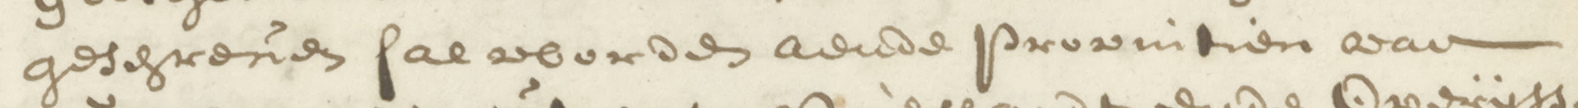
geschreuen sal worden aende Provintien van
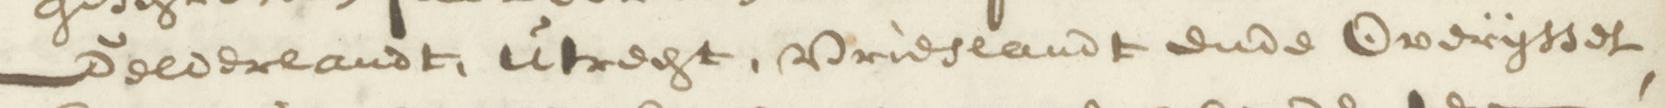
Gelderlandt, Utrecht, Vrieslandt ende Overijssel,
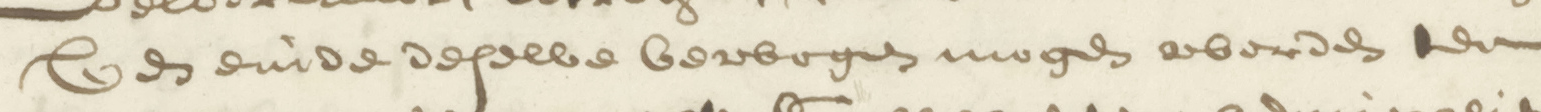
Ten einde deselve bewogen mogen worden ten
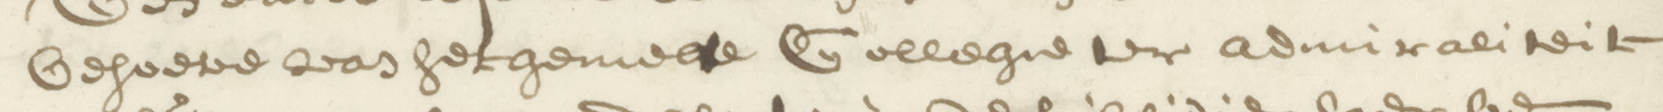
behoeve van het gemelte Collegie ter admiraliteit
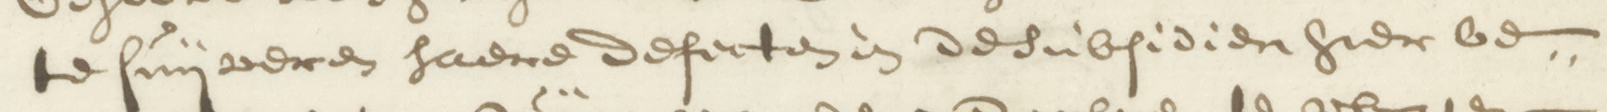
te suijveren haere defecten in de subsidien hier be„
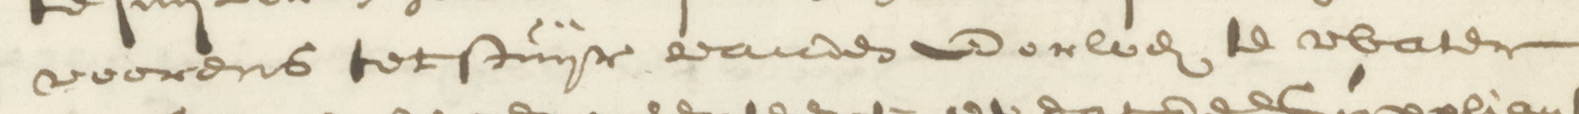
voorens tot stuijr vanden Oorloch te water
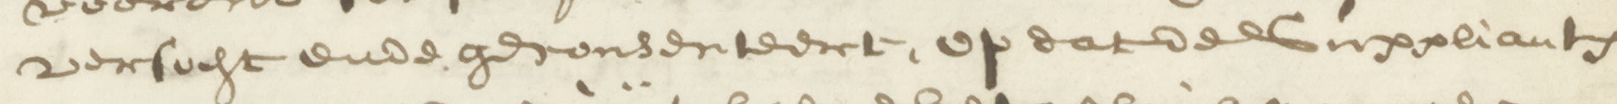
versocht ende geconsenteert, op dat de Supplianten
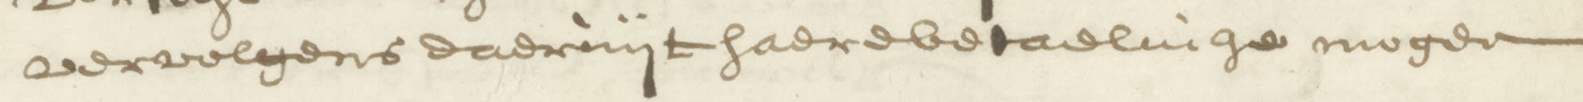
vervolgens daeruijt haere betaelinge mogen
